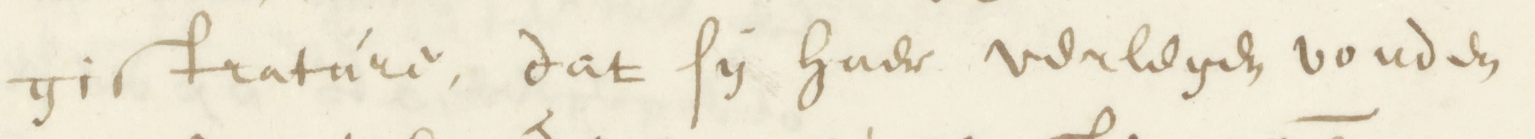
gistrature, dat sij haer verlegen vonden
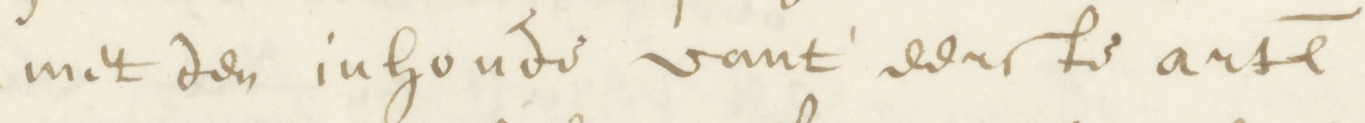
met den inhoude vant‛ eerste artl.
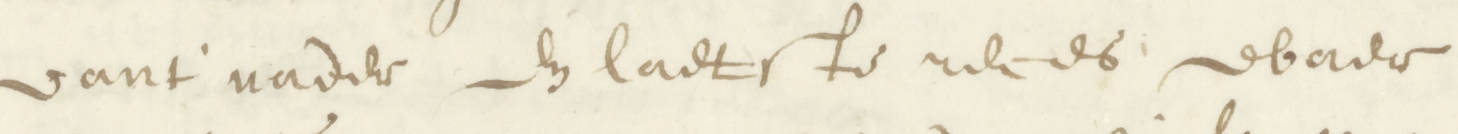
vant‛ nader en laetste reces waer
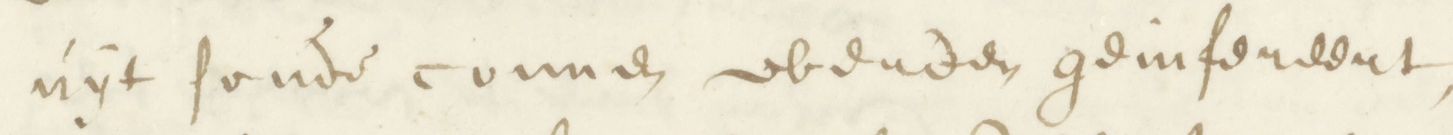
uijt soude connen werden geinfereert,
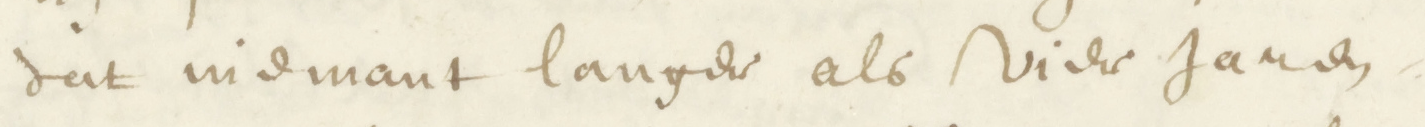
dat niemant langer als vier Jaren
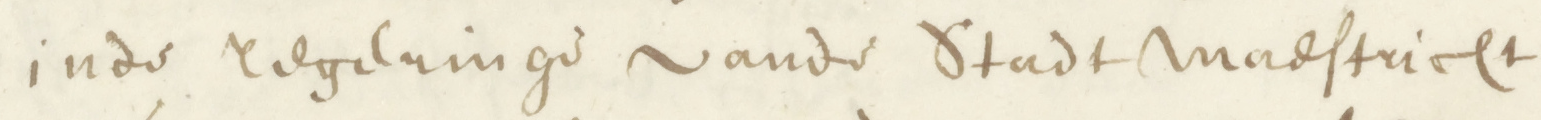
inde regeringe vande Stadt maestricht
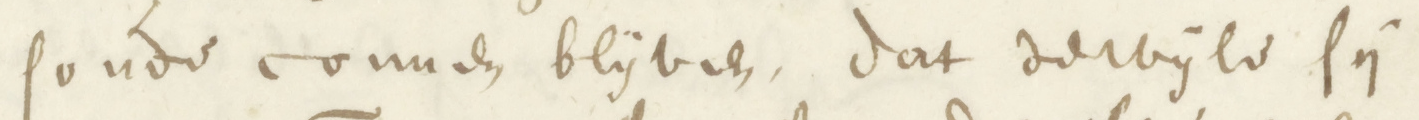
soude connen blijven, dat dewijle sij
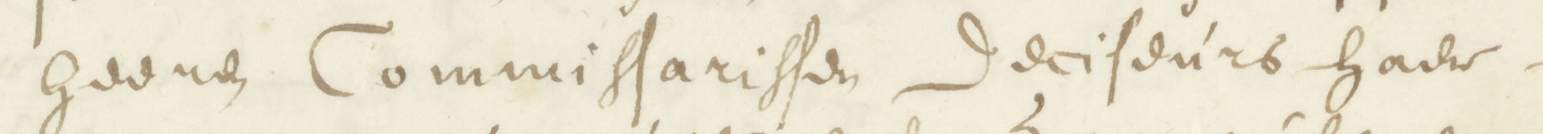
heeren Commissarissen Decideurs haer
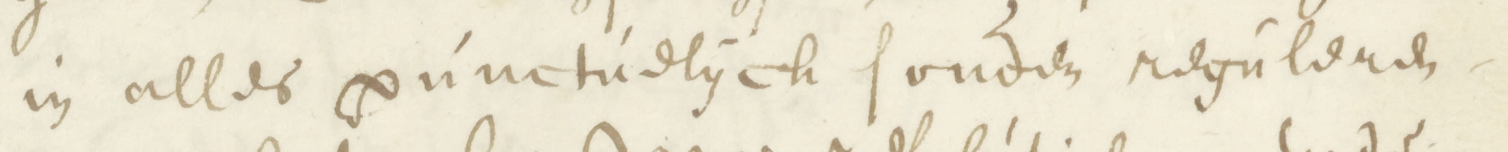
in alles punctuelijck souden reguleren
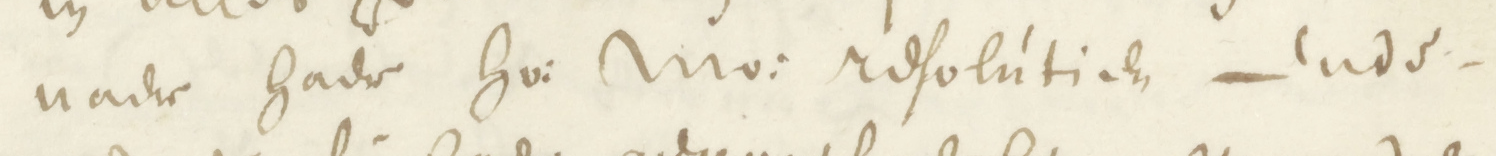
naer haer ho:Mo: resolutien ende
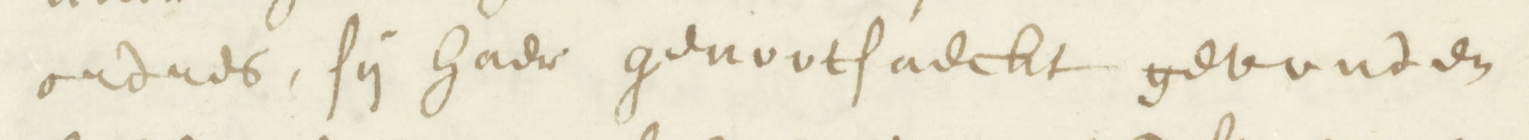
ordres, sij haer genootsaeckt gevonden
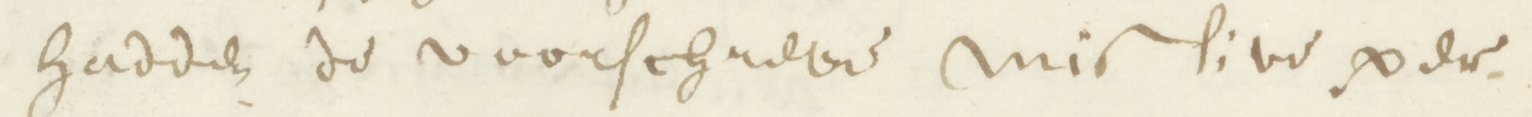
hadden de voorschreve missive per
